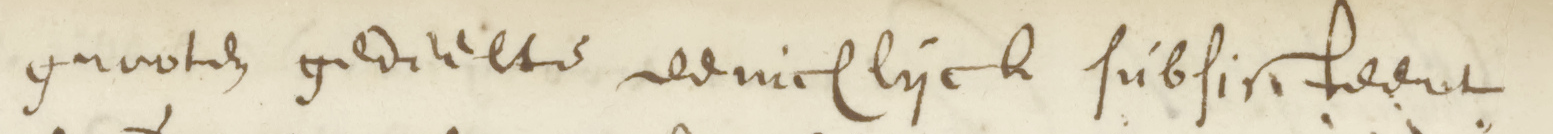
grooten gedeelte eenichlijck subsisteert
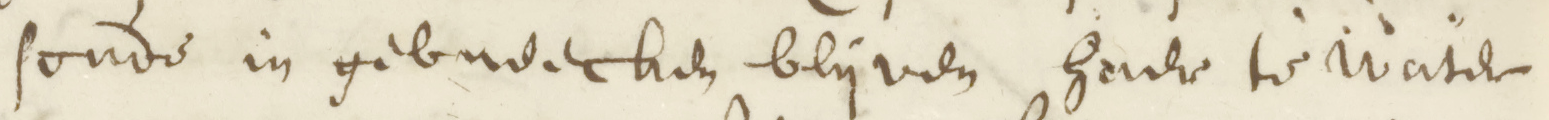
soude in gebreecken blijven haer te water
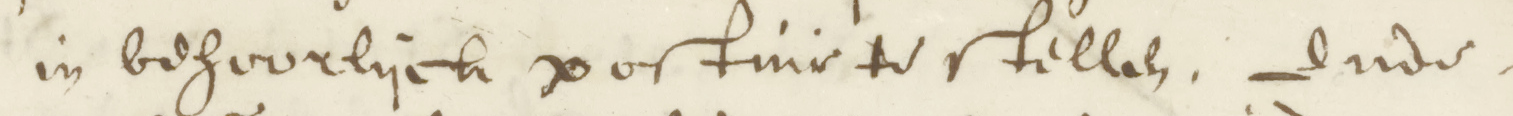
in behoorlijck postuur te stellen, ende
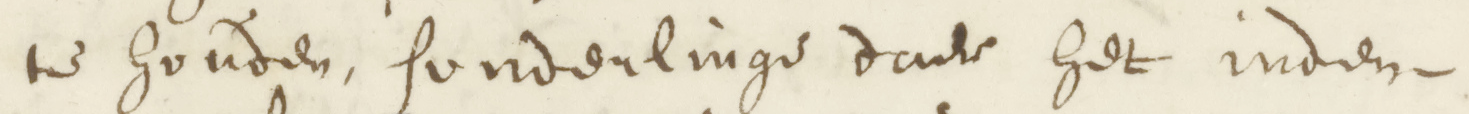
te houden, sonderlinge daer het inden -
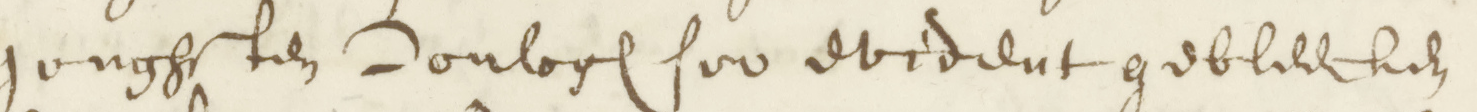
jonghsten Oorlogh soo evident gebleecken
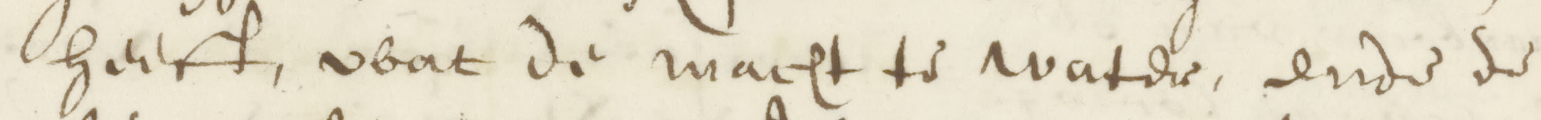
heeft, wat de macht te water, ende de
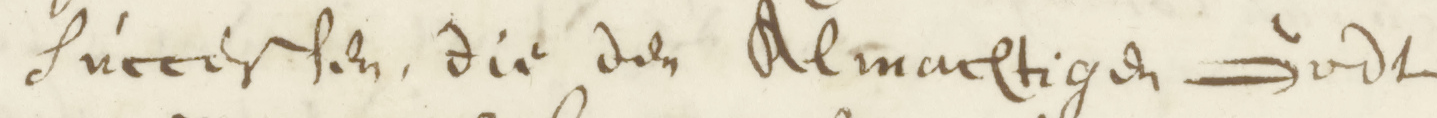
successen, die den Almachtigen Godt
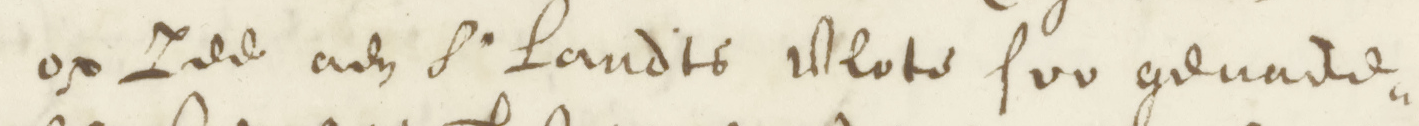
op Zee aen s'Landts Vlote soo genade„
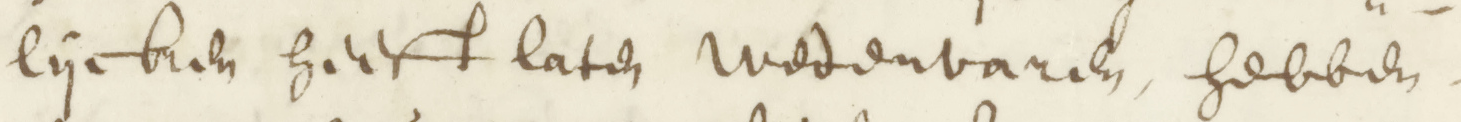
lijcken heeft laten wedervaren, hebben
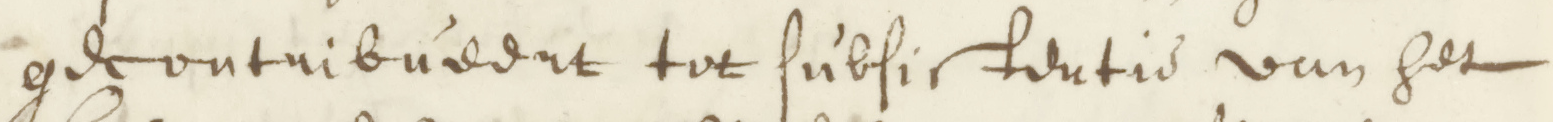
gecontribueert tot subsistentie van het
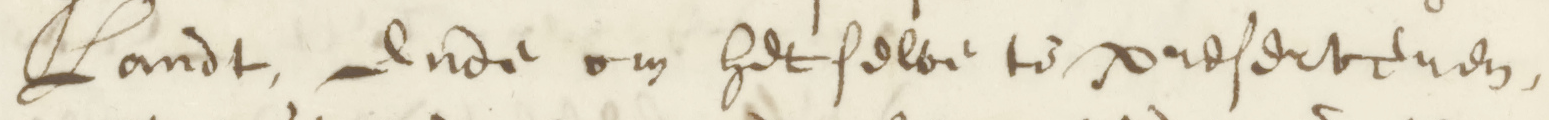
Landt, ende om het selve te preserveren,
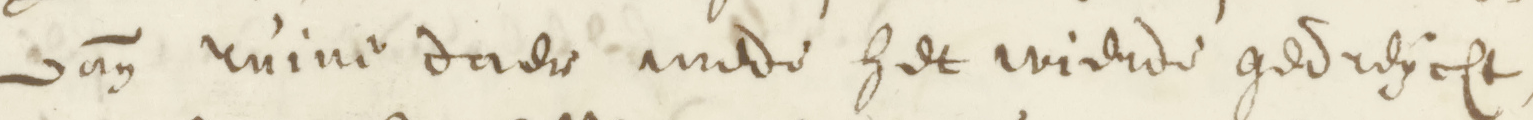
van ruine daer mede het wierde gedreijcht,
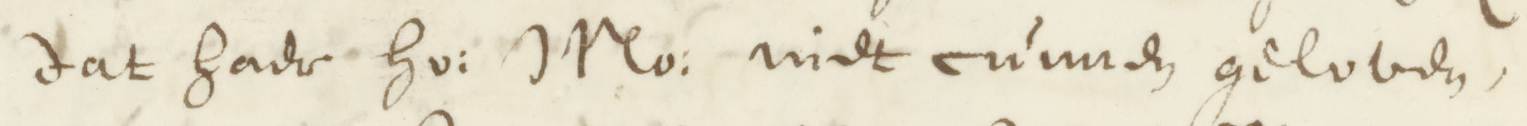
dat haer ho:Mo: niet cunnen geloven,
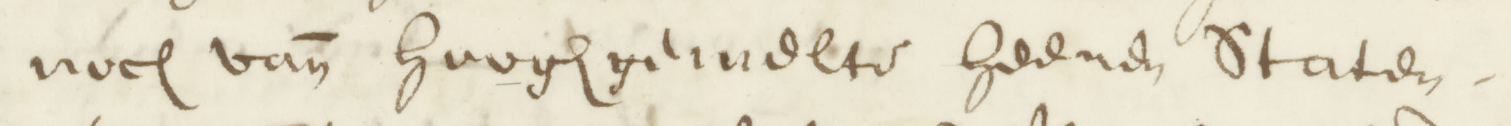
noch van hooghgemelte heeren Staten
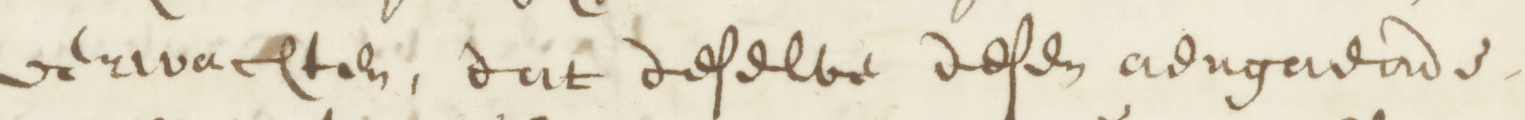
verwachten, dat deselve desen aengaende
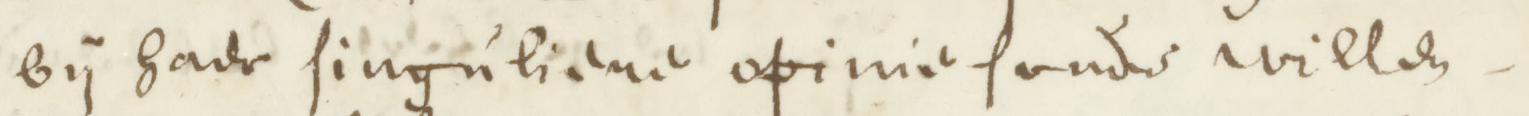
bij haer singuliere opinie soude willen
